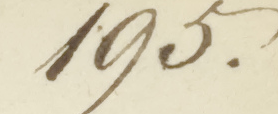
195.
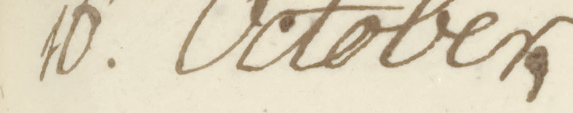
16. October
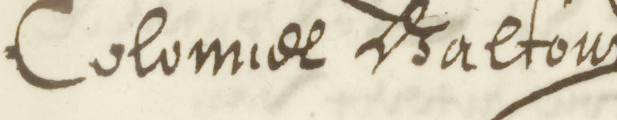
Colonnel Balfour
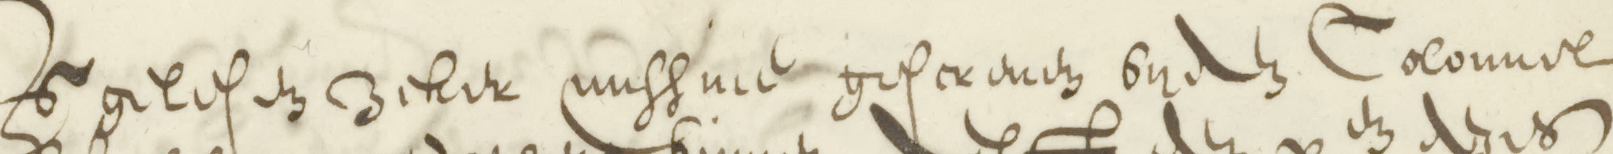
Is gelesen zeker missive gescreven byden Colonnel
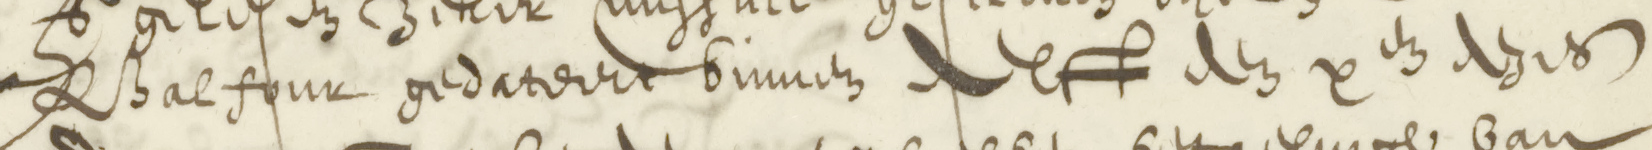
Balfour gedateert binnen Delff den Xen deses
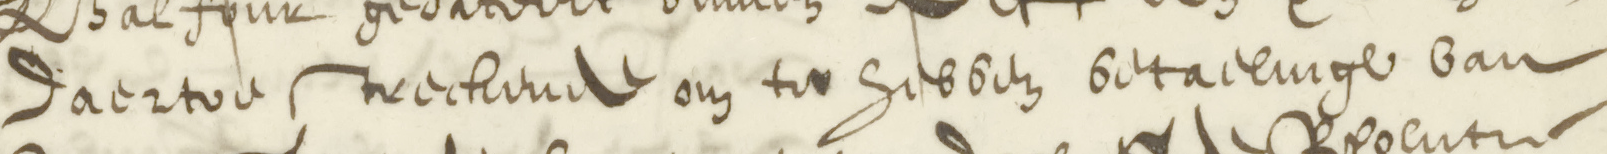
daertoe streckende om te hebben betaelinge van
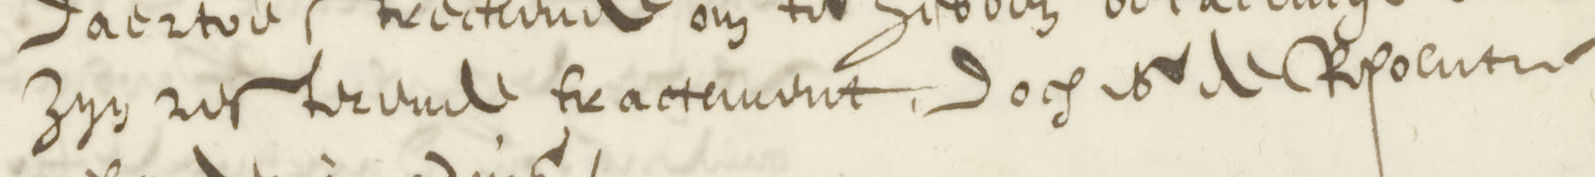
zyn resterende tractement, doch es de Resolutie
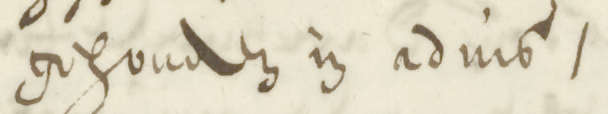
gehouden in aduis.
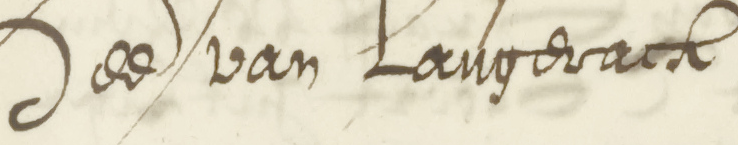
Heer van Langerack
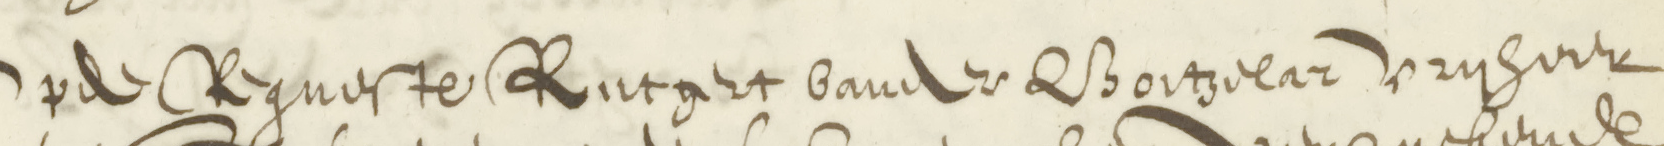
Opde Requeste Rutgert vander Boitzelar vryheer
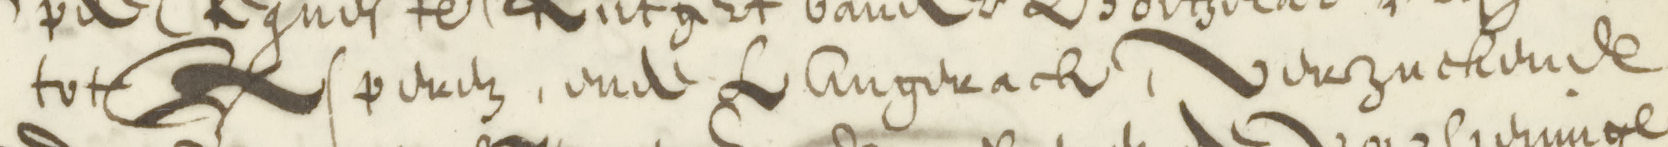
tot Asperen, ende Langerack, verzuckende
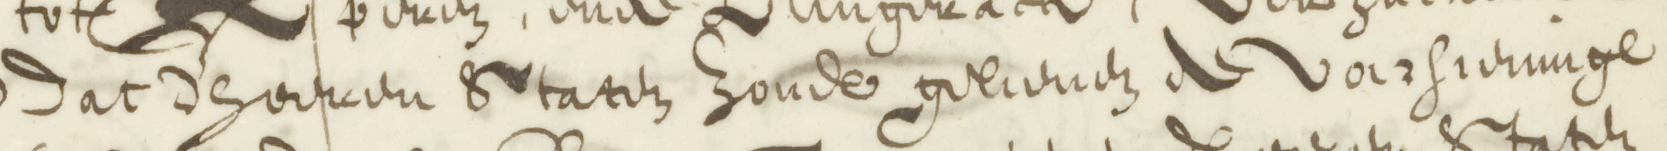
dat dheeren Staten zoude gelieven de voirsieninge
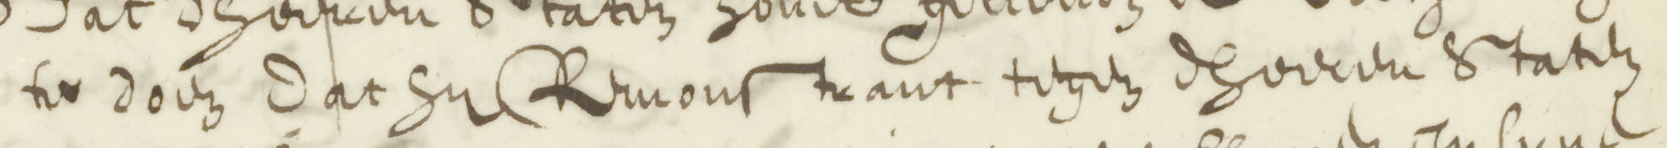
te doen dat hy Remonstrant tegen dheeren Staten
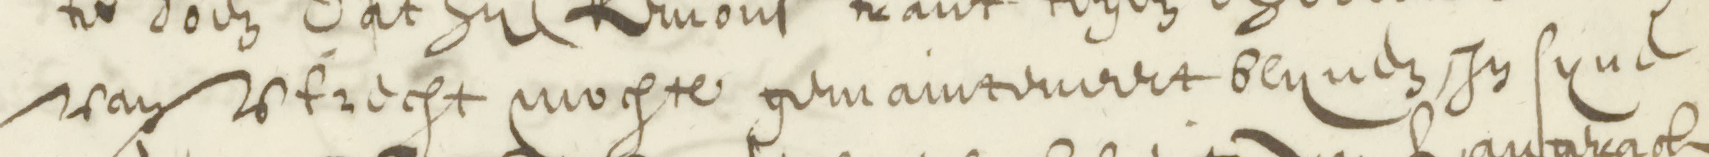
van Utrecht mochte gemainteneert blyuen, in syne
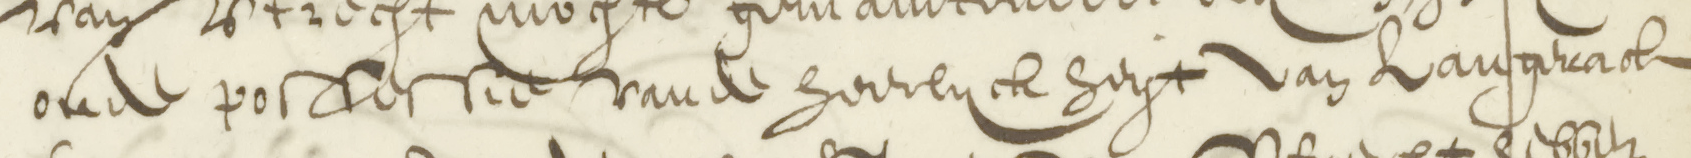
oude possessie vande heerlycheyt van Langerack
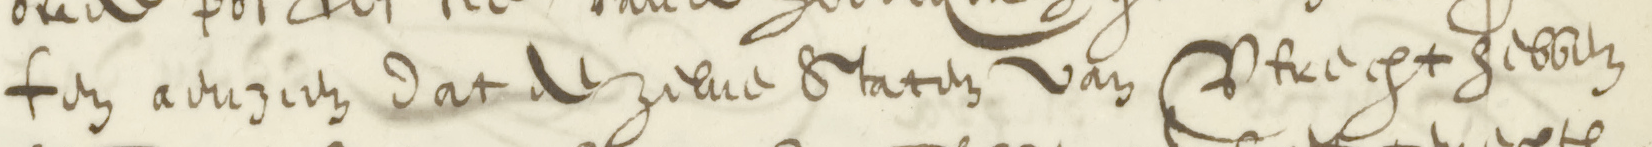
ten aenzien dat dezelve Staten van Utrecht hebben
